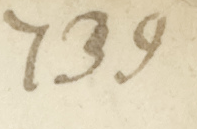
739
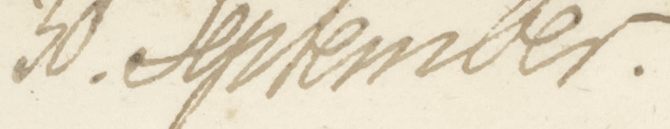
30. September.
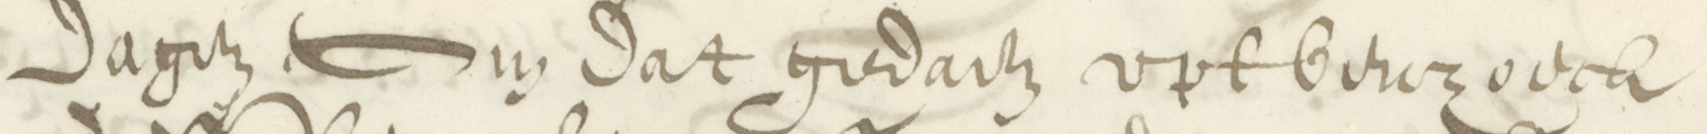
dagen om dat gedaen opt verzoeck
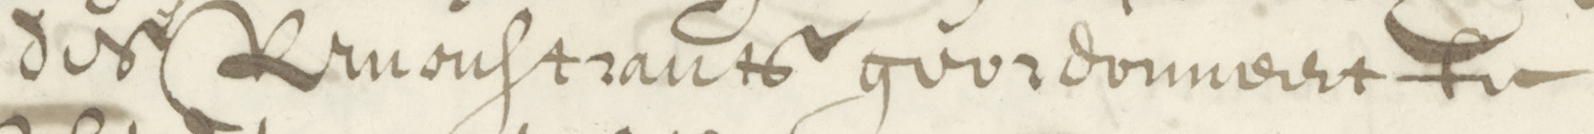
des Remonstrants geordonneert te
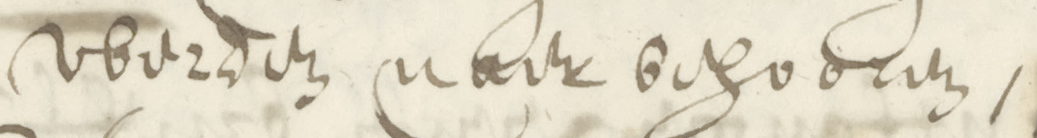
werden naer behooren.
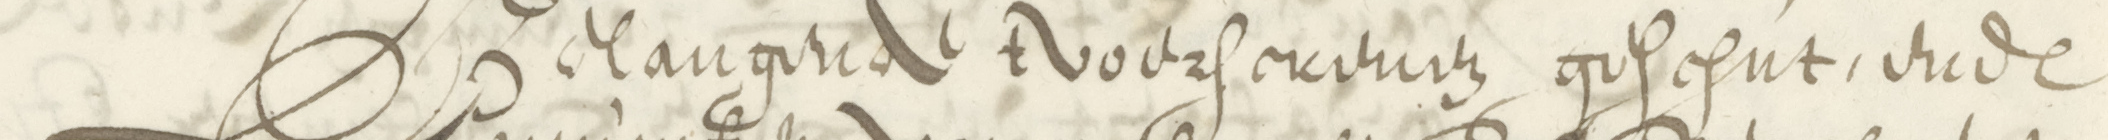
Belangende tvoerscreuen geschut, ende
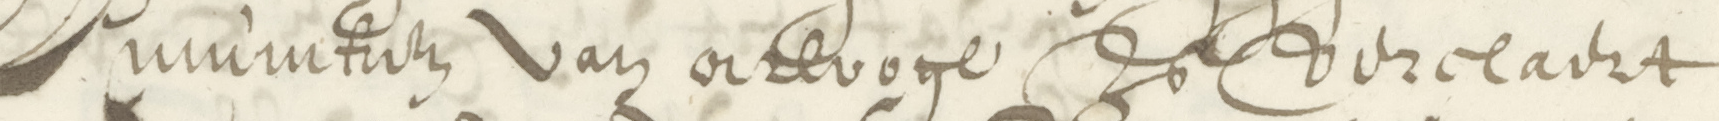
Munitien van oirlooge Is verclaert
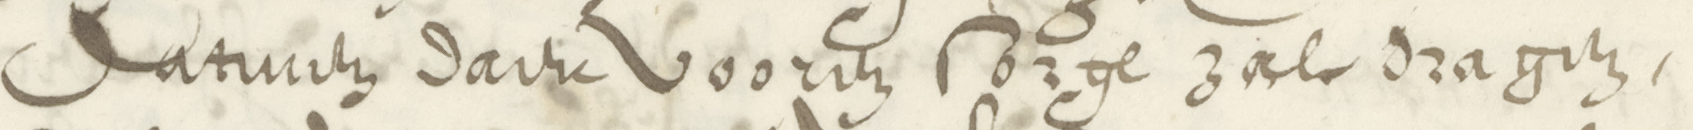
datmen daer vooren sorge zal dragen,
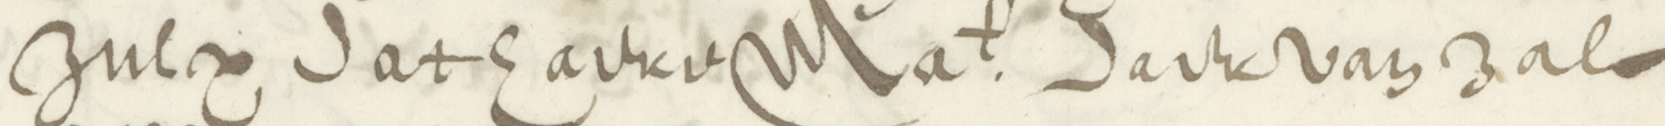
zulx dat haere Mat. daer van zal
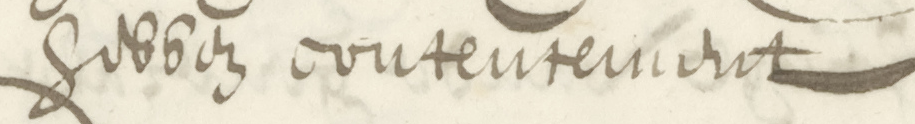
hebben contentement
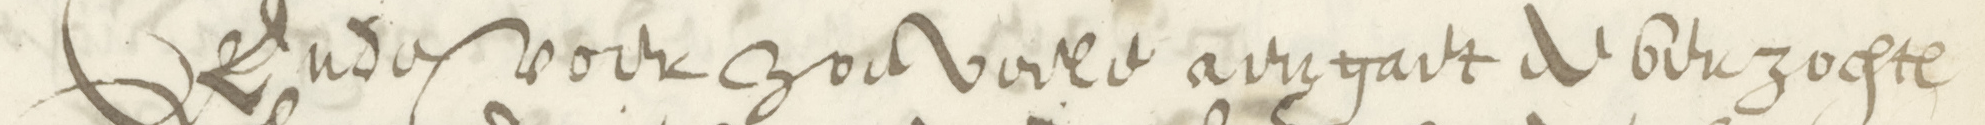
Ende voer zoe veele aengaet de verzochte
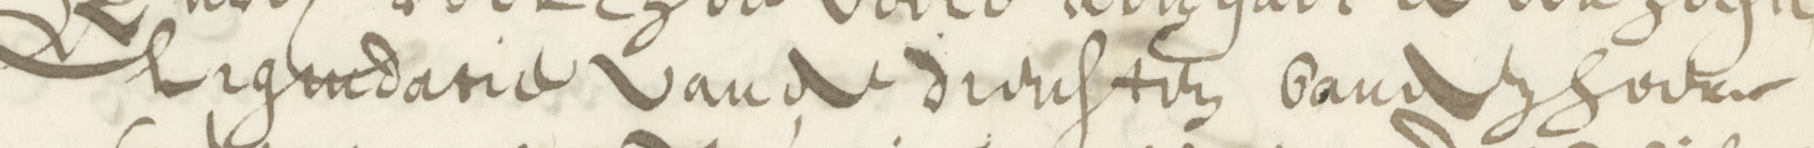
liquidatie vande diensten vanden heere
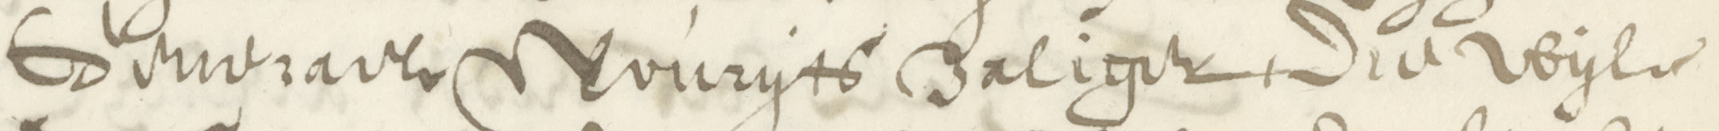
Generael Mouryts zaliger, die wijle
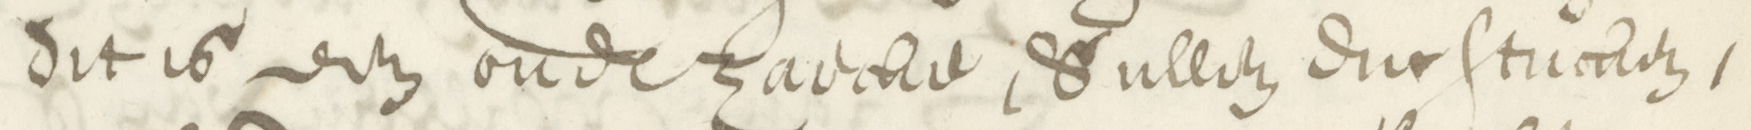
dit is een oude zaecke, sullen die stucken,
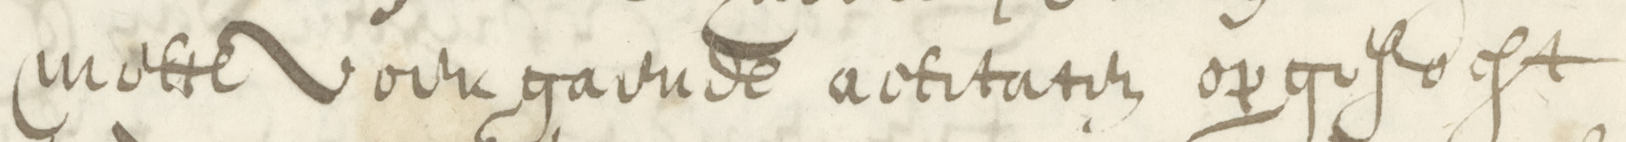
mette voergaende actitaten opgesocht
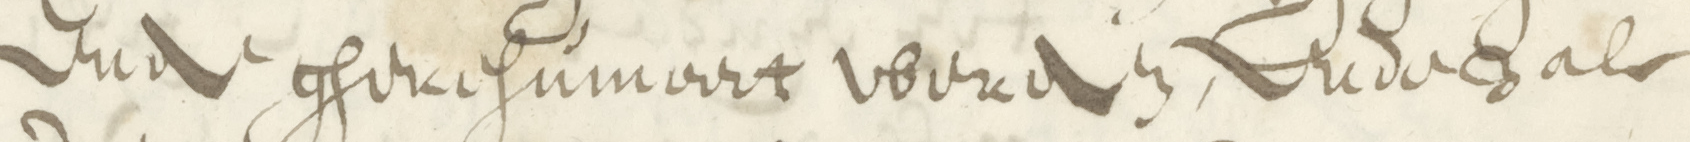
ende gheresumeert werden, ende zal
